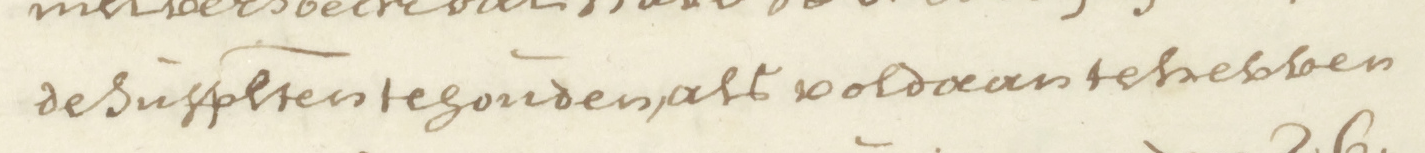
de supplten te houden als voldaan te hebben
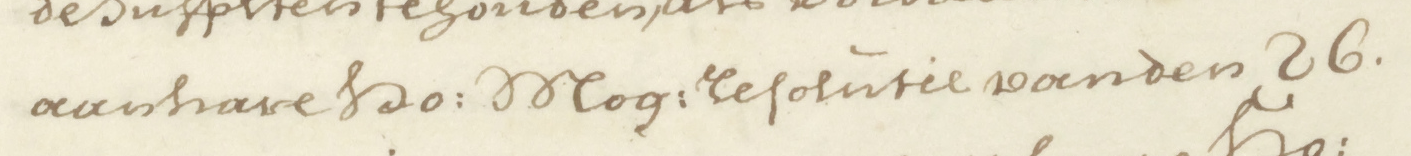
aan hare Ho:Mog: resolutie vanden 26.
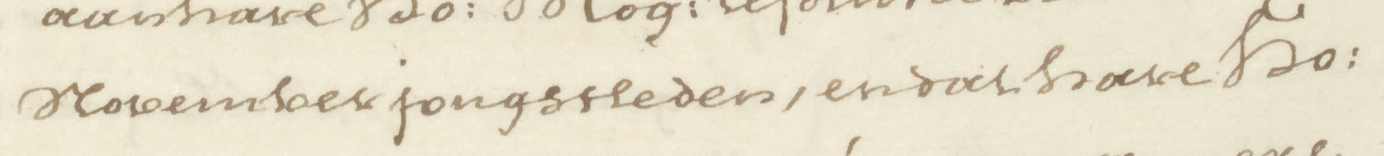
November jongstleden, en dat hare Ho:
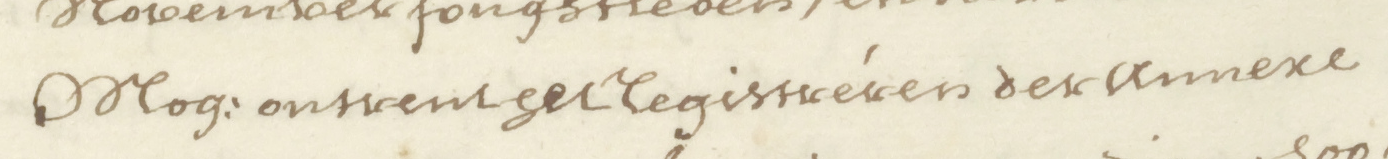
Mog: ontrent het registreren der annexe
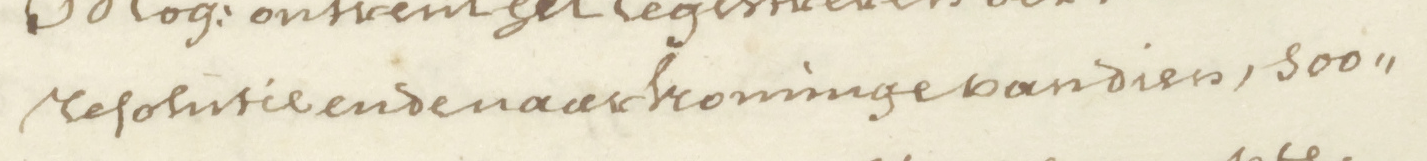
resolutie ende naarkominge vandien, soo„
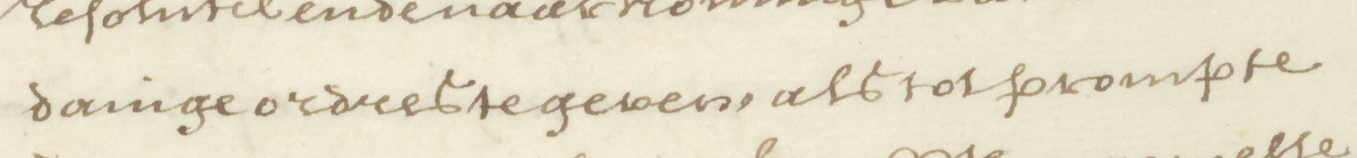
danige ordres tegeven als tot prompte
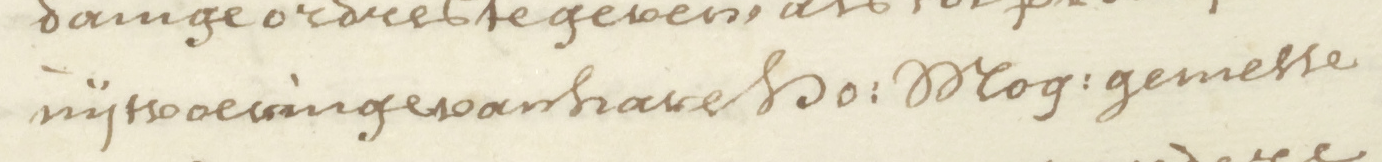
uijtvoeringe van hare Ho:Mog: gemelte
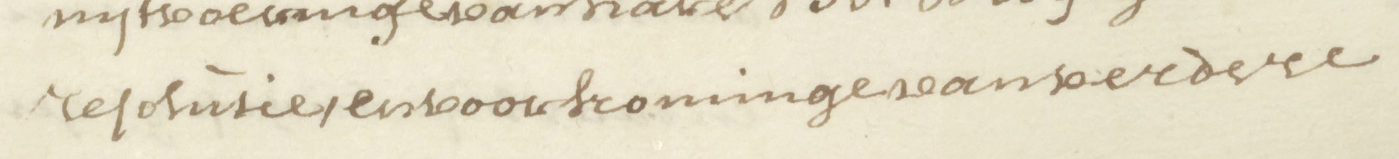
resolutie, en voorkominge van verdere
